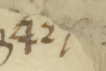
427
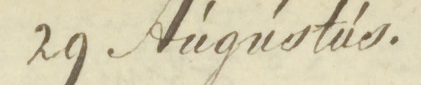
29 Augustus.
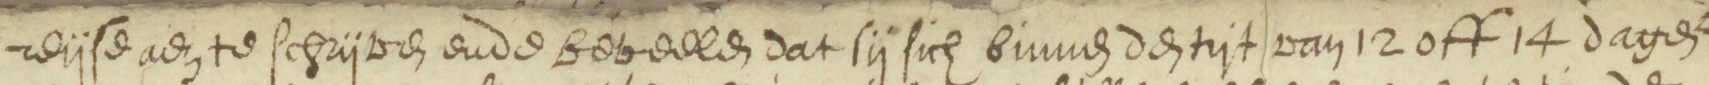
reijse aen te schrijven ende beveelen dat sij sich binnen den tijt van 12 off 14 dagen
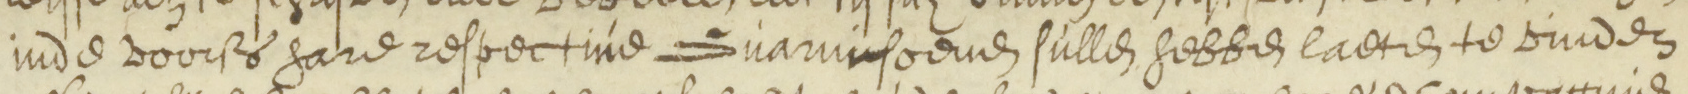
inde voors hare respectiue Guarnisoenen sullen hebben laeten te vinden
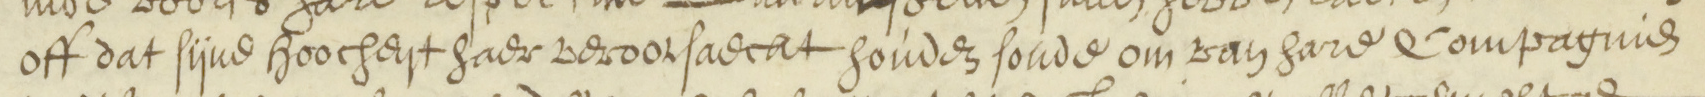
off dat sijne Hoocheyt haer veroorsaeckt houden soude om van hare Compagnien
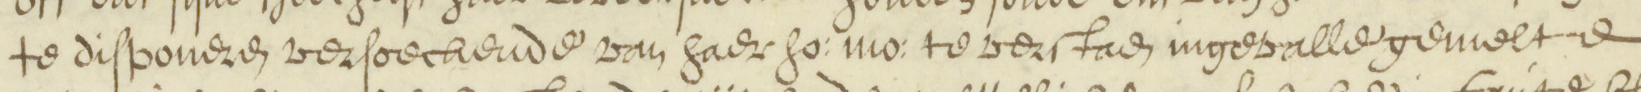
te disponeren versoeckende van haer ho:mo: te verstaen ingevalle gemelte
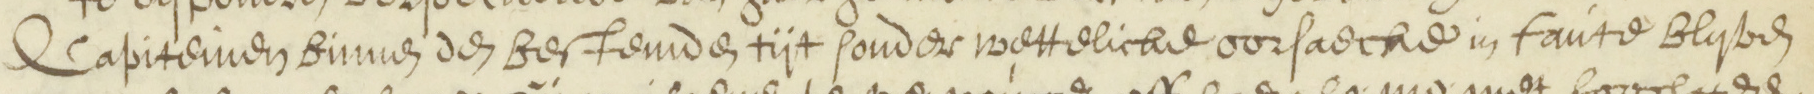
Capiteinen binnen den bestemden tijt sonder wettelicke oorsaecke in faute blyven
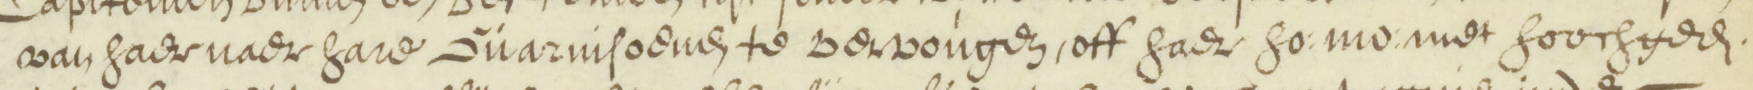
van haer naer hare Guarnisoenen te vervougen, off haer ho:mo: met hoochgee.
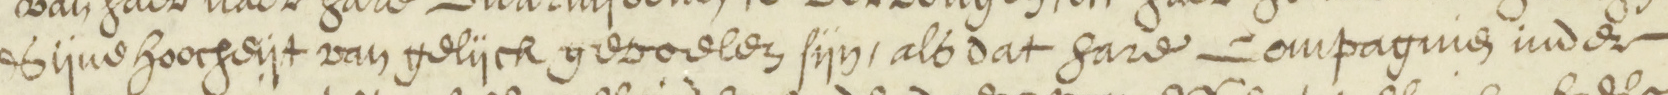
Sijne hoocheijt van gelijck gevoelen sijn, als dat hare Compagnien inder
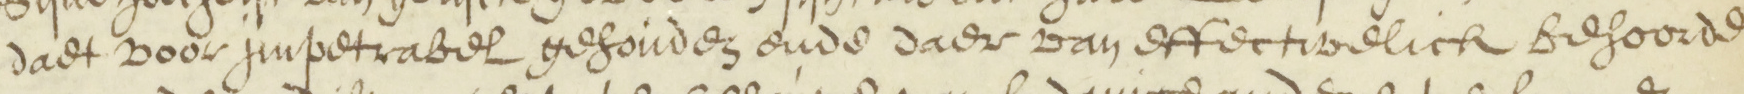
daet voor Impetrabel gehouden ende daer van effectivelick behoorde
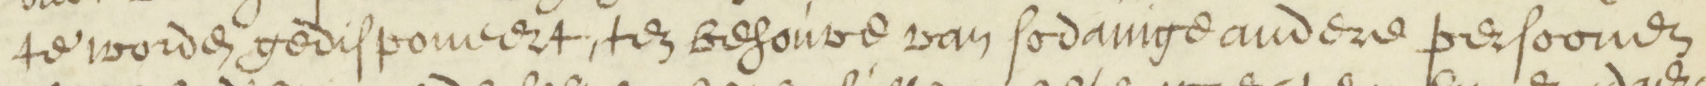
te worden gedisponeert, ten behouve van sodanige andere persoonen
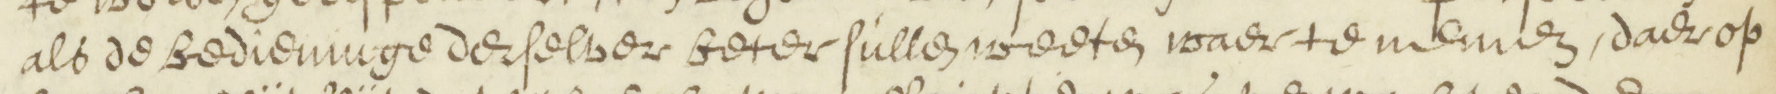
als de bedieninge derselver beter sullen weeten waer te nemen, daer op
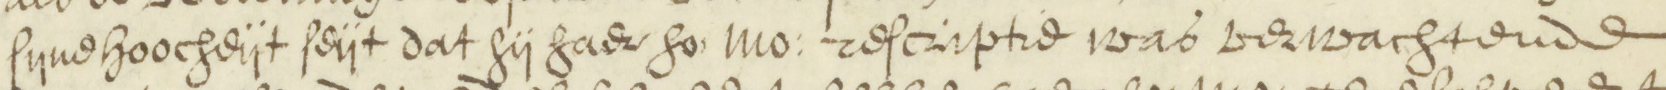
syne hoocheijt seijt dat hij haer ho:mo: rescriptie was verwachtende
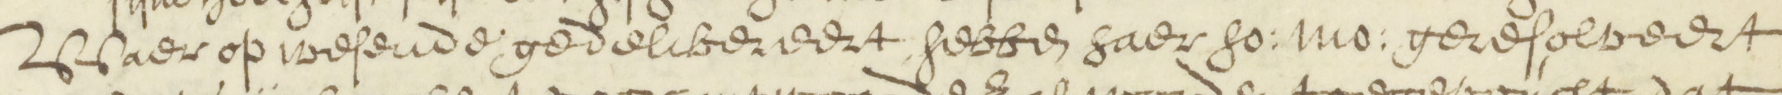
Waer op wesende gedelibereert, hebben haer ho:mo: geresolveert
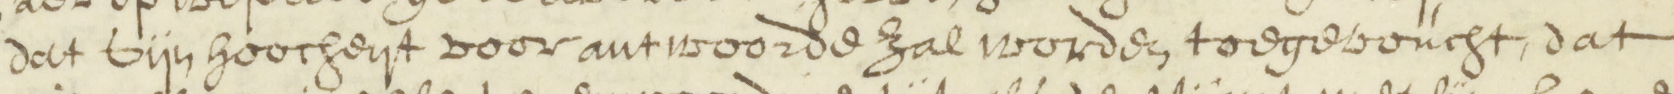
dat Sijn hoocheyt voor antwoorde zal worden toegevoucht, dat
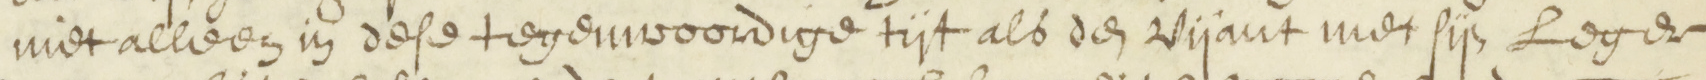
niet alleen in dese tegenwoordige tijt als den Vijant met sijn leger
